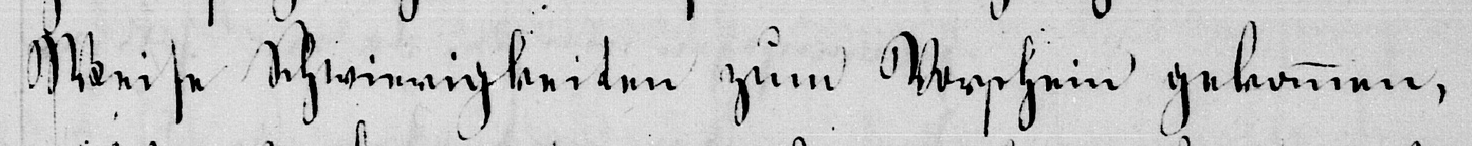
Weise Schwierigkeiten zum Vorschein gekommen,
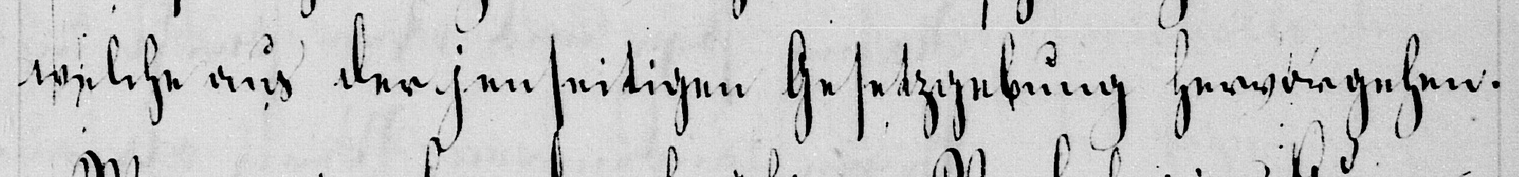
welche aus der jenseitigen Gesetzgebung hervorgehen.
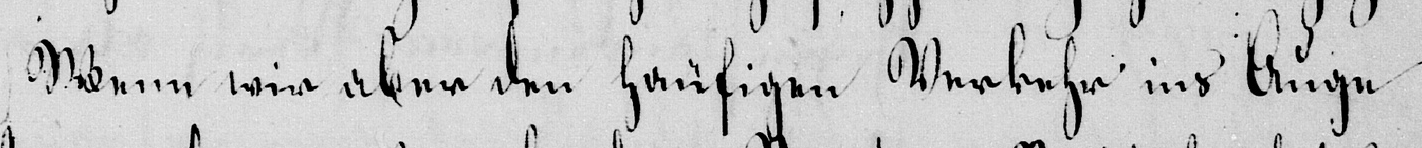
Wenn wir aber den häufigen Verkehr ins Auge
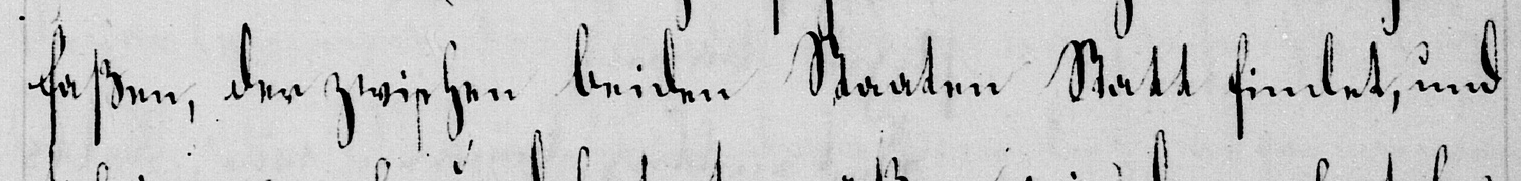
faßen, der zwischen beiden Staaten Statt findet, und
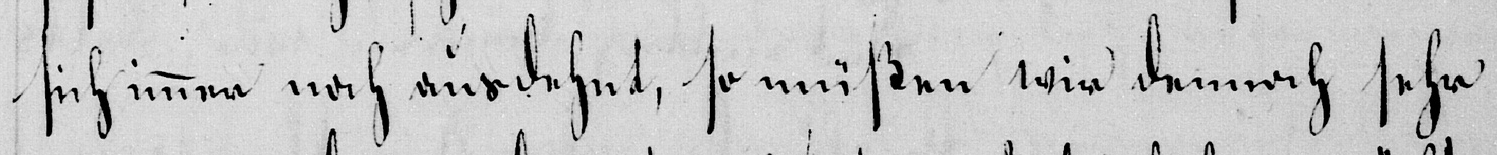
sich immer noch ausdehnt, so müßen wir dennoch sehr
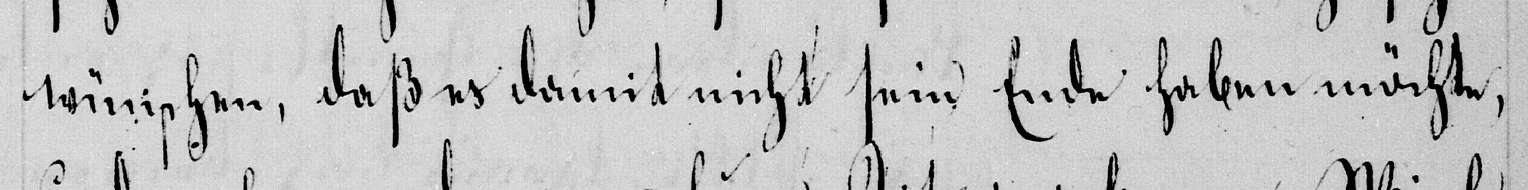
wünschen, daß es damit nicht sein Ende haben möchte,
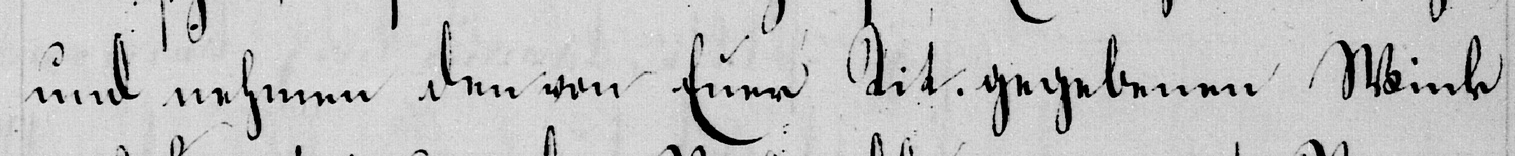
und nehmen den von Euer Tit. gegebenen Wink
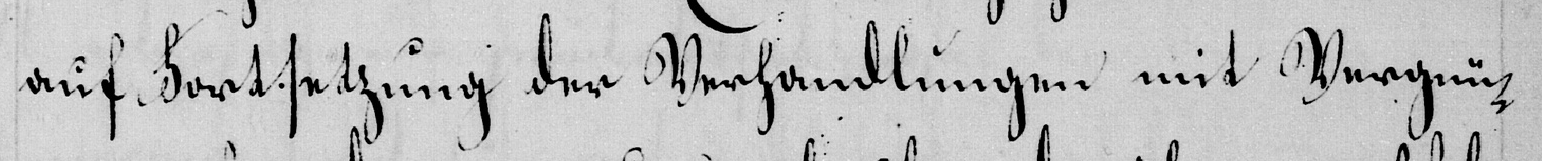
auf Fortsetzung der Verhandlungen mit Vergnü¬
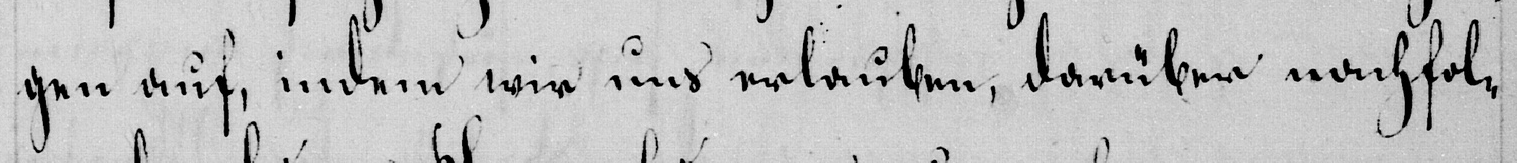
gen auf, indem wir uns erlauben, darüber nachfol¬
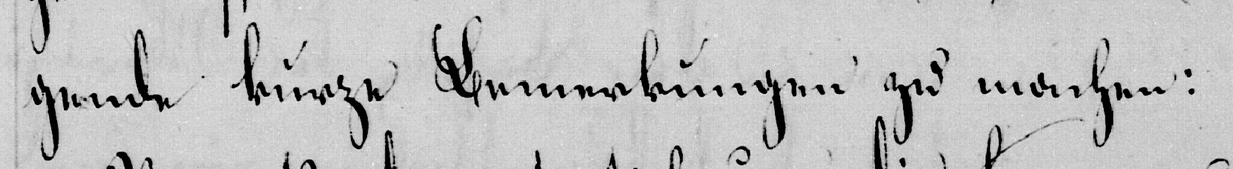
gende kurze Bemerkungen zu machen:
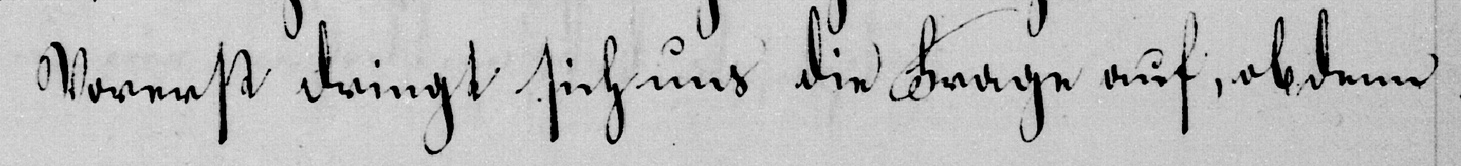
Vorerst dringt sich uns die Frage auf, ob denn
